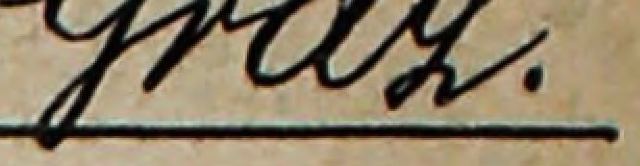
Graz.
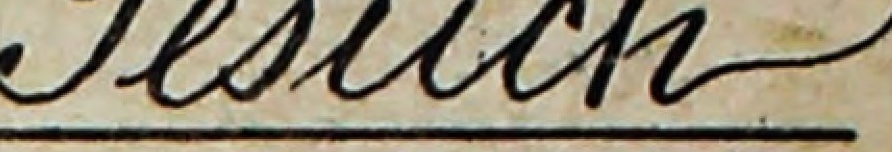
Gesuch
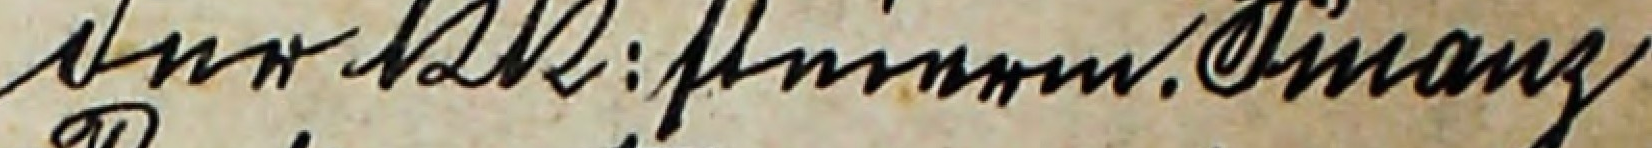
der kk: steierm. Finanz
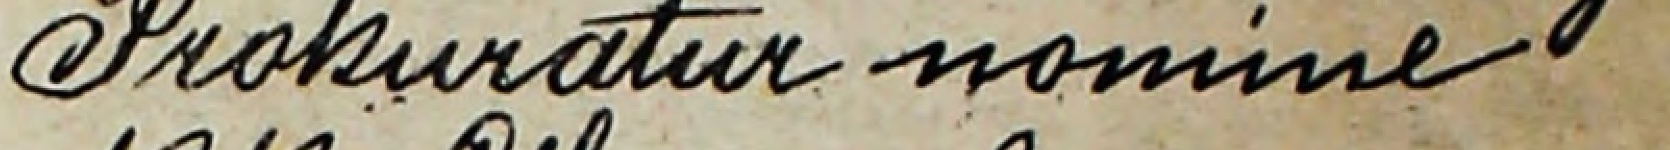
Prokuratur nomine
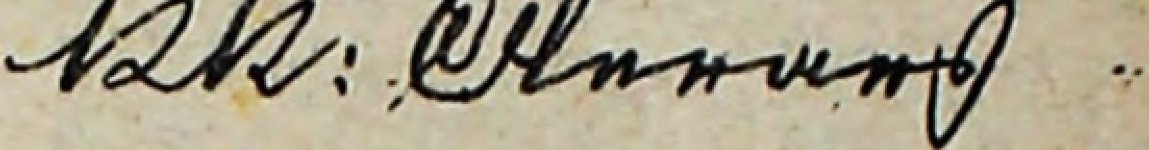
kk: Aerars
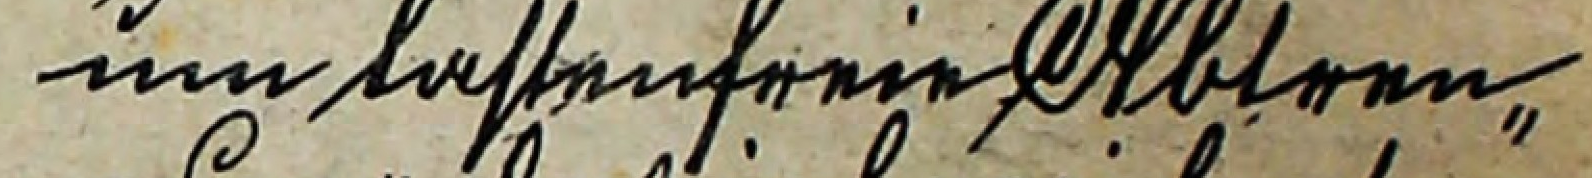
um lastenfreie Abtren„
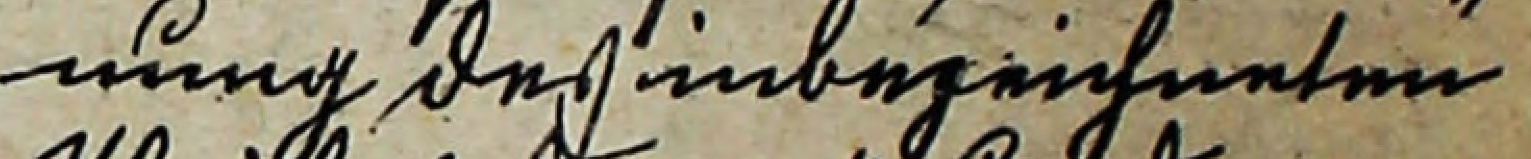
nung des inbezeichneten
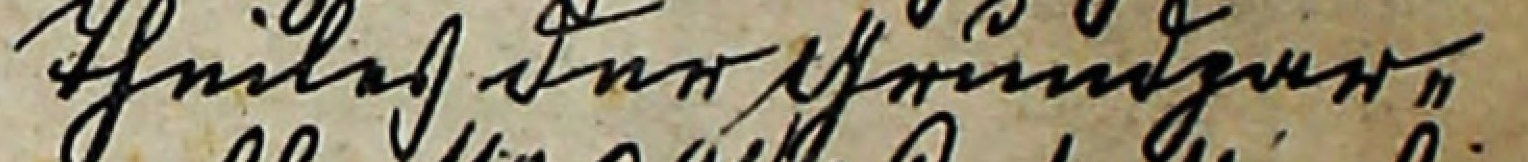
Theiles der Grundpar„
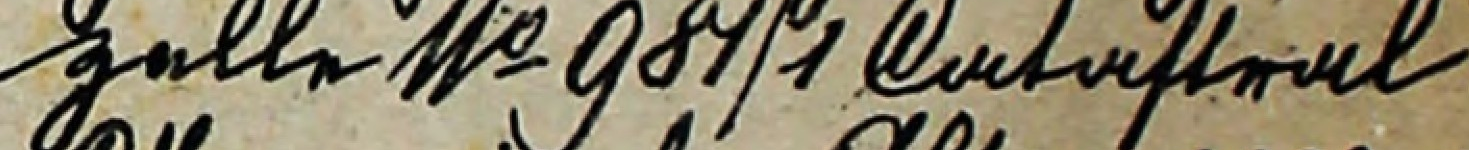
zelle No 981/1 Catastral
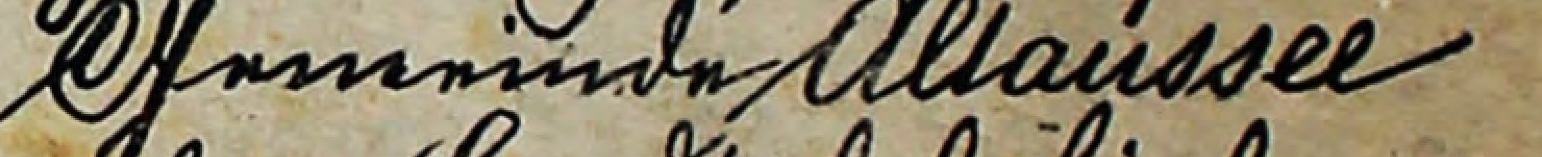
Gemeinde Altaussee
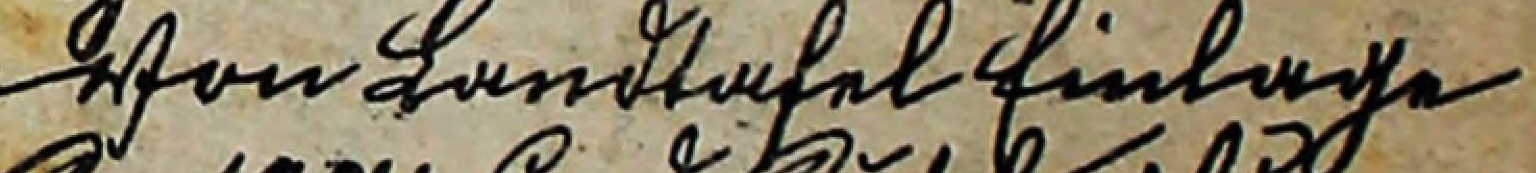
von Landtafel Einlage
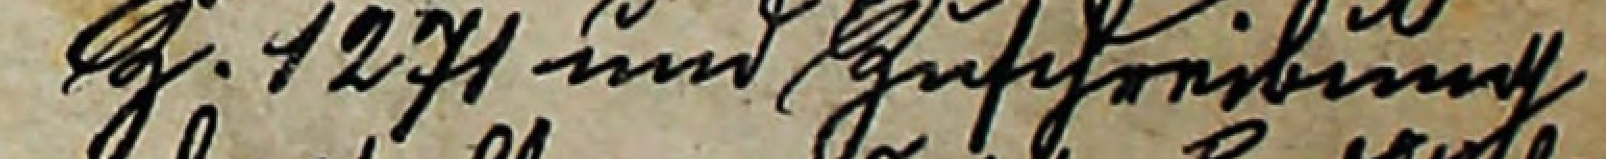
Z. 1271 und Zuschreibung
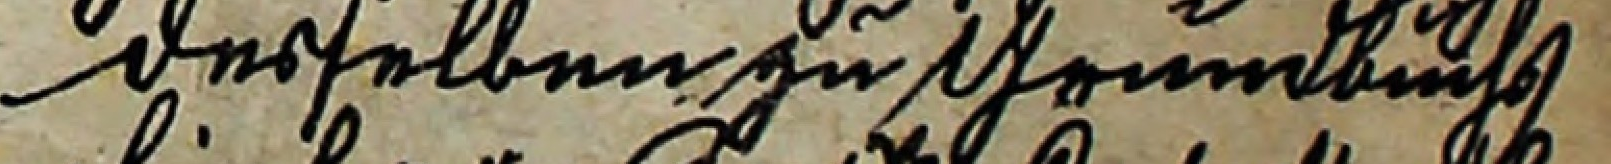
desselben zu Grundbuchs
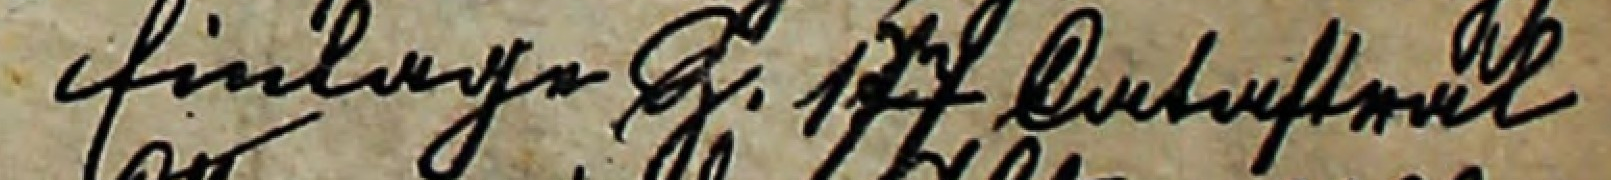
Einlage Z. 177 Catastral
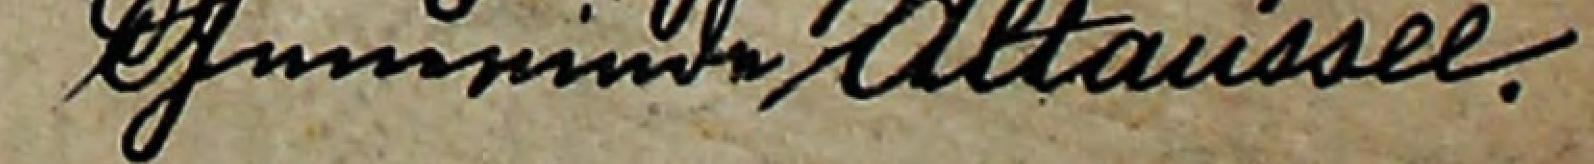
Gemeinde Altaussee.
